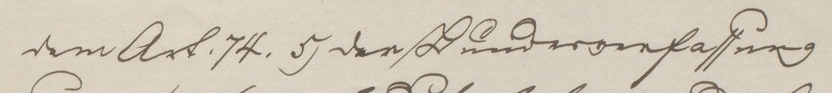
dem Art. 74. 5, der Bundesverfassung
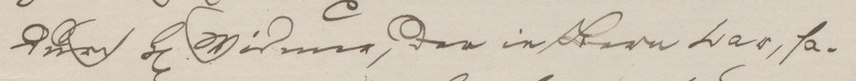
durch Hr Widmer, der in Bern war, sa-
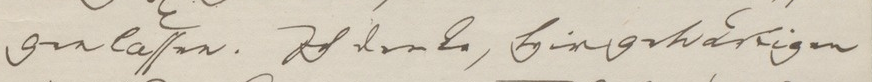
gen lassen. Ich denke, wir gewärtigen
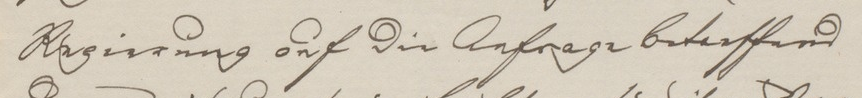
Regierung auf die Anfrage betreffend
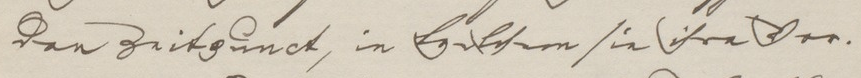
den Zeitpunct, in welchem sie ihre Vor-
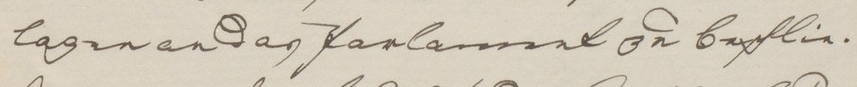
lagen an das Parlament zu beschlie-
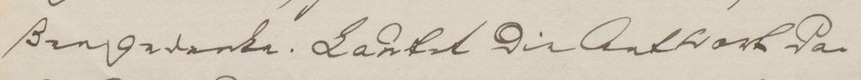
ßen gedenke. Lautet die Antwort da-
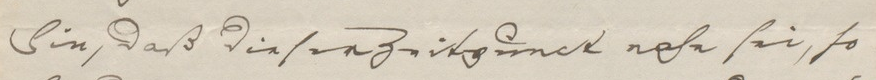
hin, daß dieser Zeitpunct nahe sei, so
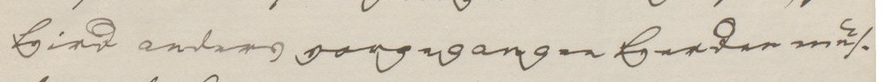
wird anders vorgegangen werden müs-
